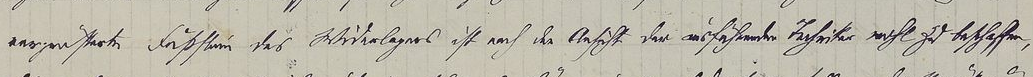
vergrößerte Fußstein des Widerlagers ist nach der Ansicht der ausführenden Techniker wohl zu beschaffen,
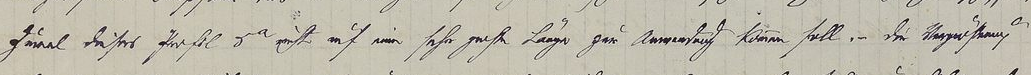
zumal dieses Profil 9a nicht auf einer sehr große Länge zur Anwendung kommen soll. – Die Vergrößerung
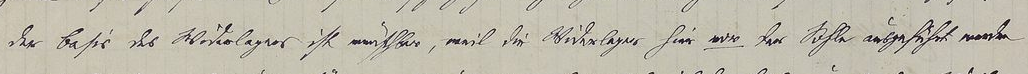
der Basis des Widerlagers ist wünschbar, weil die Widerlager hier vor der Sohle ausgeführt werden
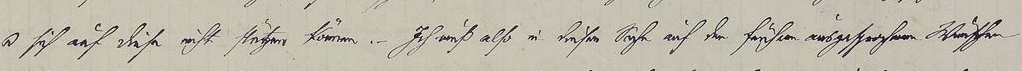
& sich auf diese nicht stützen können. – Ich muß also in dieser Sache auf den früher ausgesprochenen Wünschen
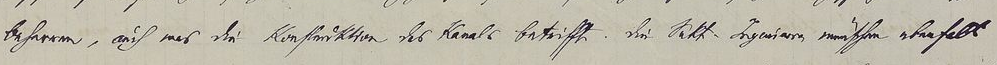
beharren, auch was die Konstruktion des Kanals betrifft. Die Sekt.Ingenieure wünschen ebenfalls
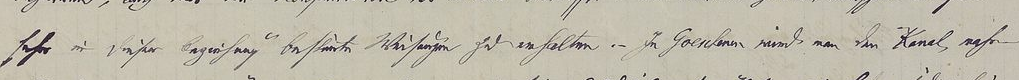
sehr in dieser Beziehung bestimmte Weisungen zu erhalten. In Goeschenen wird man den Kanal wahr-
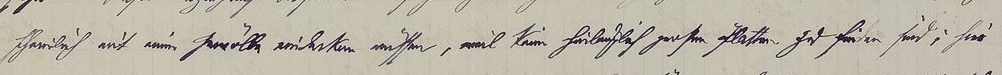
scheinlich mit einem Gewölbe eindecken müssen, weil keine hinlänglich großen Platten zu finden sind; hier
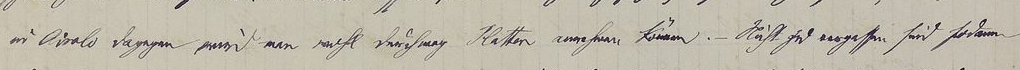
in Airolo dagegen wird man wohl durchweg Platten annehmen können. – Nicht zu vergessen sind sodann
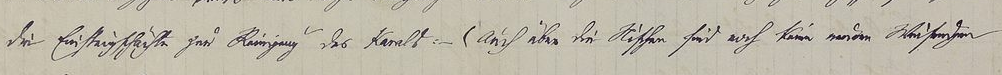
die Einstiegschächte zur Reinigung des Kanals. – (Auch über die Nischen sind noch keine neuen Weisungen
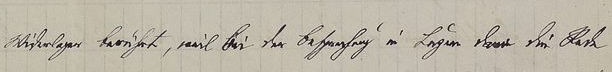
Widerlager berührt, weil bei der Besprechung in Luzern davon die Rede
